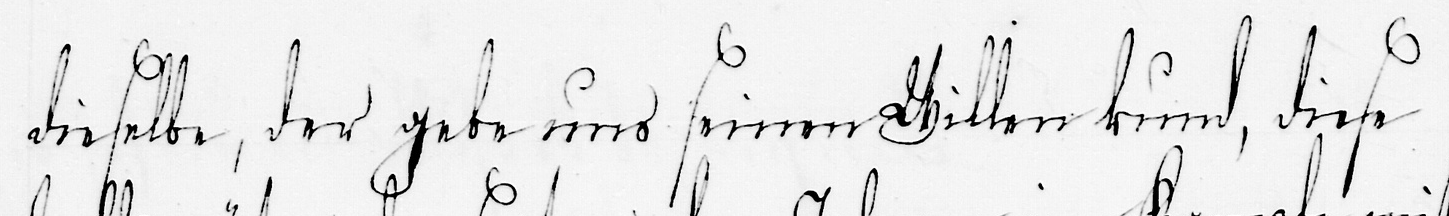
dieselbe, der gebe uns seinen Willen kund, diese
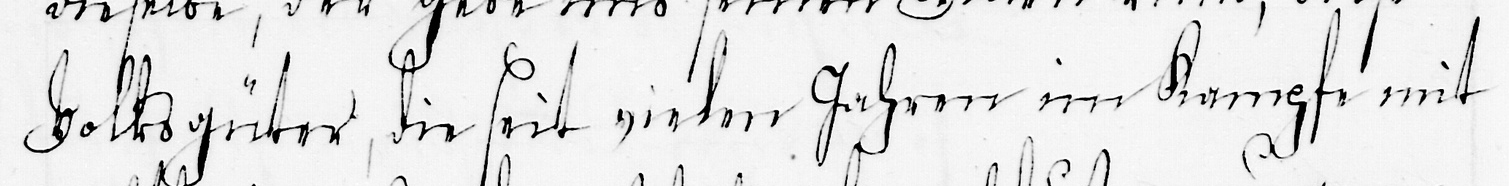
Volksgüter, die seit vielen Jahren im Kampfe mit
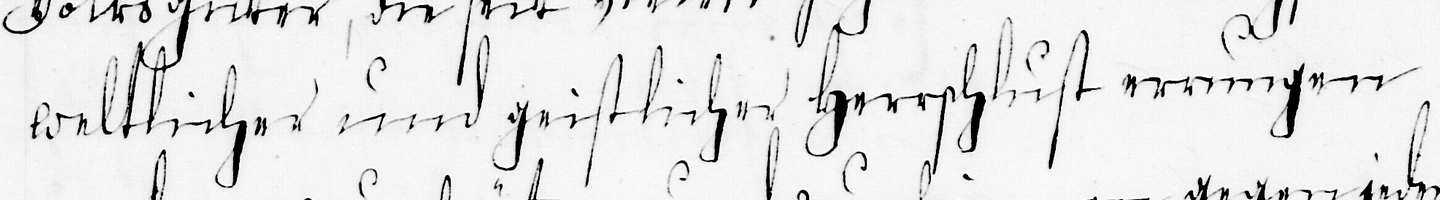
weltlicher und geistlicher Herrschlust errungen
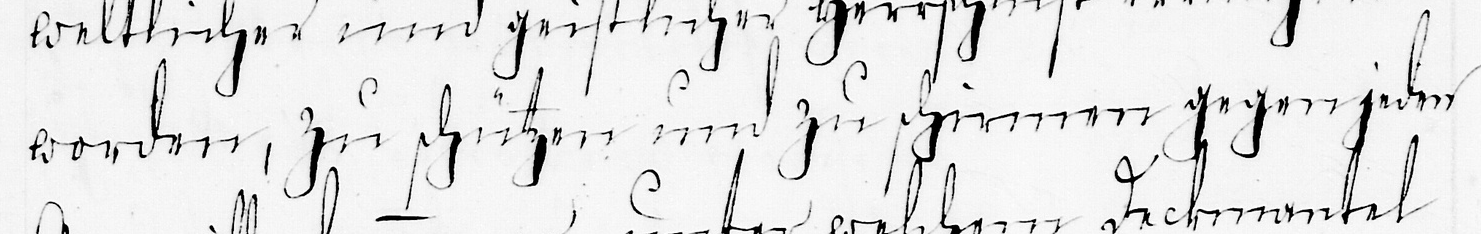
worden, zu schützen und zu schirmen gegen jeden
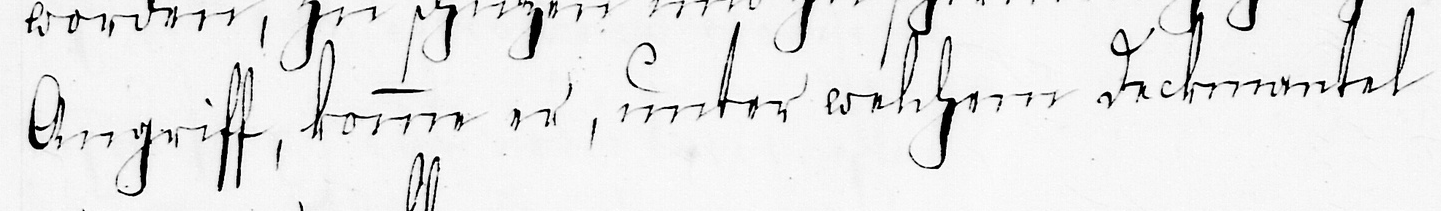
Angriff, komme er, unter welchem Deckmantel
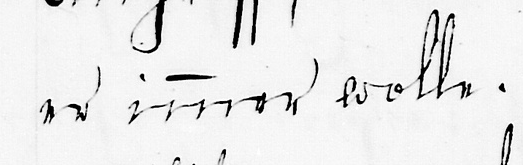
er immer wolle.
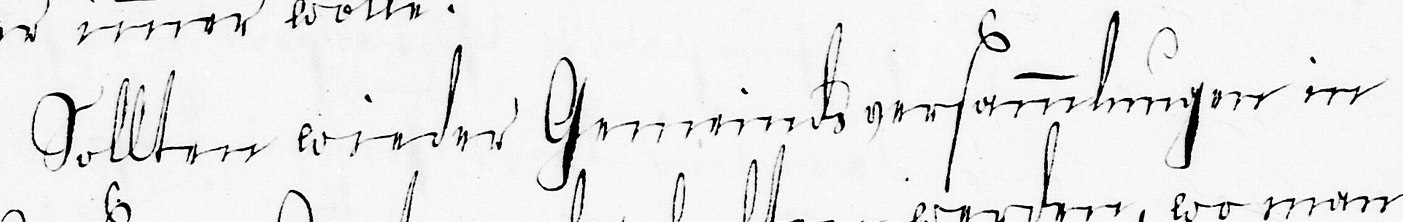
Sollten wieder Gemeindsversammlungen in
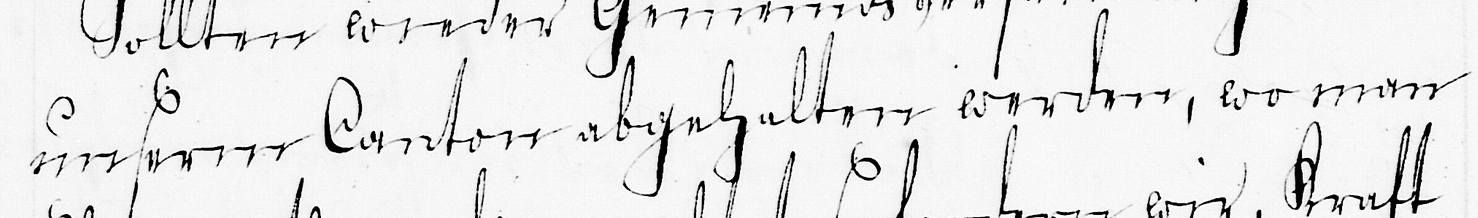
unserm Canton abgehalten werden, wo man
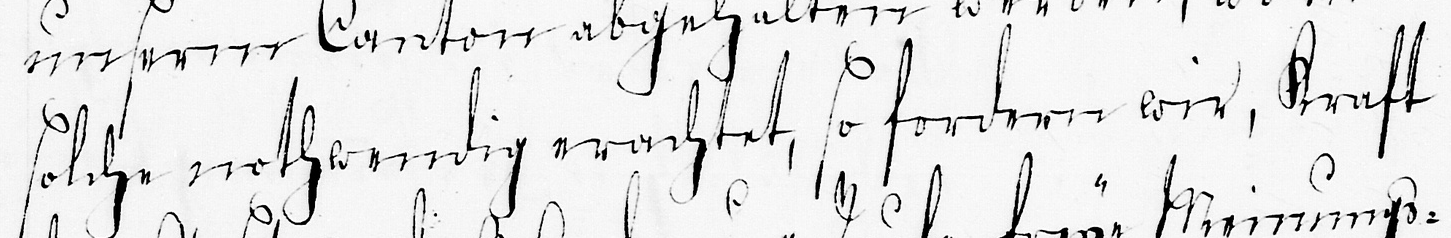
solche nothwendig erachtet, so fordern wir, Kraft
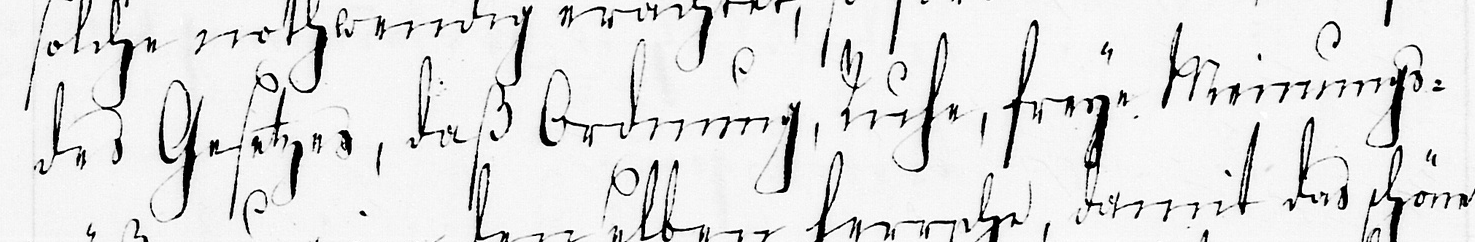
des Gesetzes, daß Ordnung, Ruhe, freye. Meinungs¬
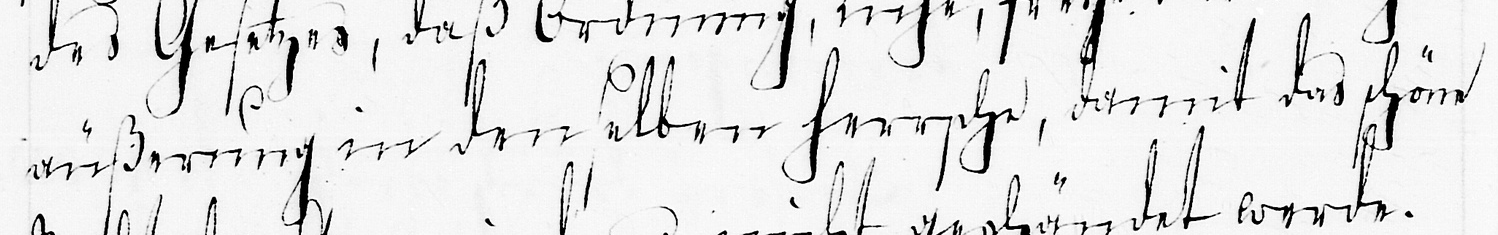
äußerung in denselben herrsche, damit das schöne
